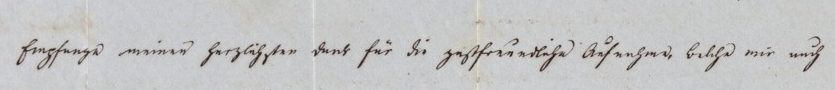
Empfange meinen herzlichsten Dank für die gastfreundliche Aufnahme, welche mir auch
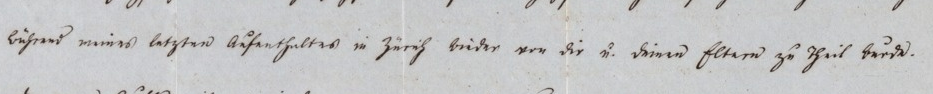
während meines letzten Aufenthaltes in Zürich wieder von dir u.deinen Eltern zu Theil wurde.
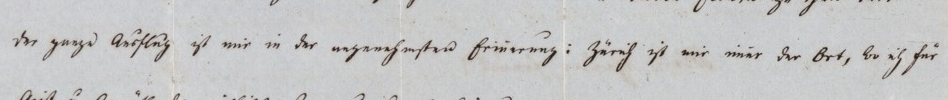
Der ganze Ausflug ist mir in der angenehmsten Erinnerung: Zürich ist mir immer der Ort, wo ich für
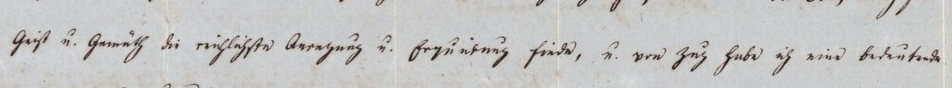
Geist u. Gemüth die reichlichste Anregung u. Erquickung finde, u. von Zug habe ich eine bedeutende
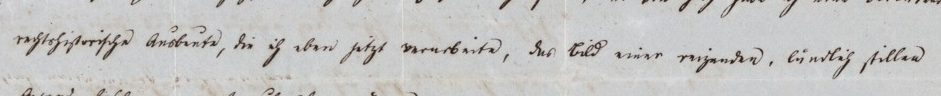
rechtshistorische Ausbeute, die ich eben jetzt verarbeite, das Bild einer reizenden, ländlich stillen
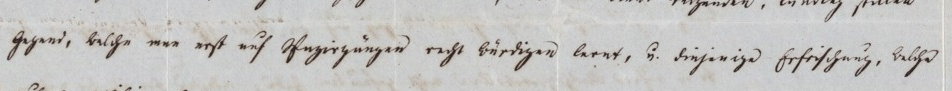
Gegend, welche man erst auf Spazirgängen recht würdigen lernt, u. diejenige Erfrischung, welche
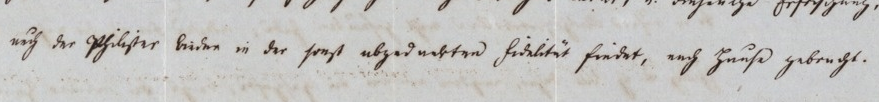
auch der Philister wieder in der sonst abgedankten Fidelität findet, nach Hause gebracht.
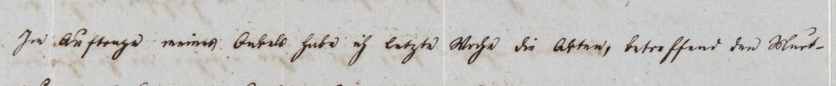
Im Auftrage meines Onkels habe ich letzte Woche die Akten, betreffend den Murt-
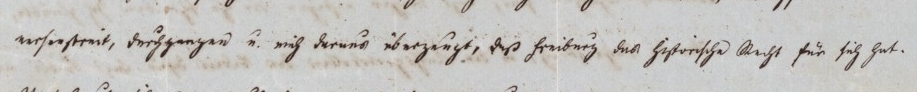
nerseestreit, durchgangen u. mich daraus überzeugt, daß Freiburg das historische Recht für sich hat.
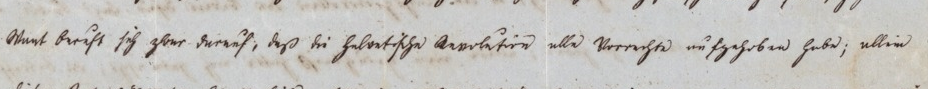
Waat beruft sich zwar darauf, daß die hevetische Revolution alle Vorrechte aufgehoben habe; allein
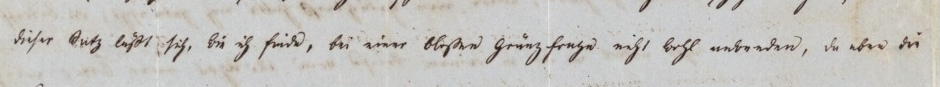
dieser Satz läßt sich, wie ich finde, bei einer bloßen Gränzfrage nicht wohl anwenden, da eben die
